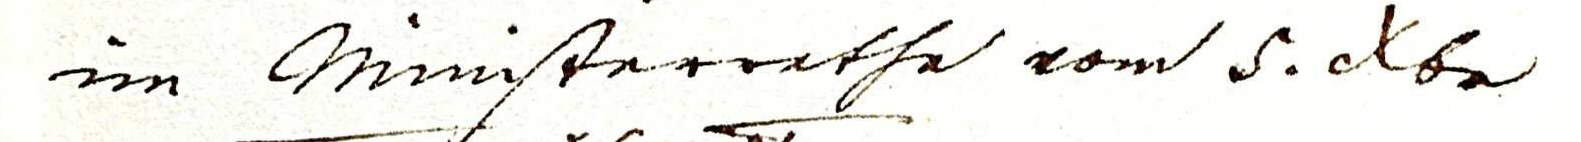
im Ministerrathe vom 5. Xbr
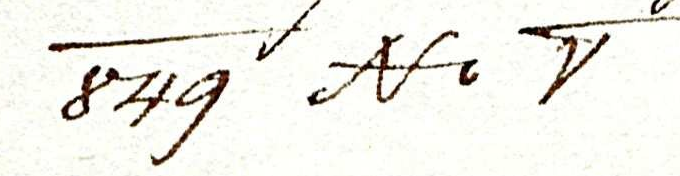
849 No V
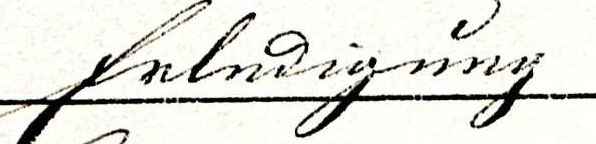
Erledigung
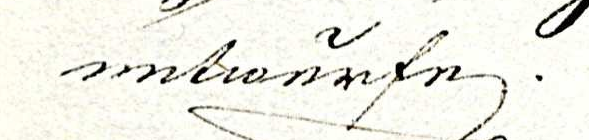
entwurfe.
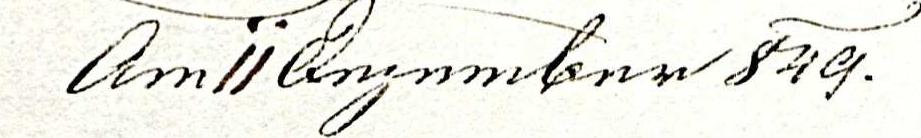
Am 11 Dezember 849.
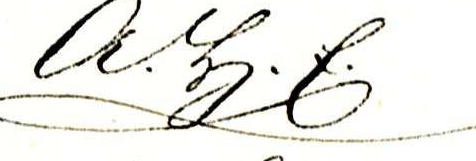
A. H. E.
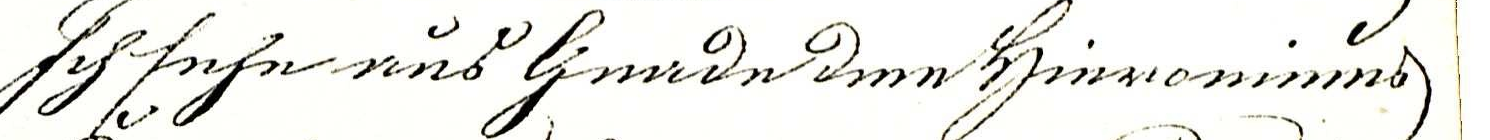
Jch sehe aus Gnade dem Hieronimus
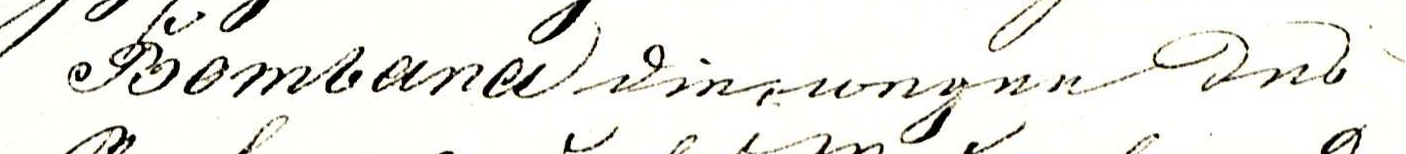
Bombana die wegen des
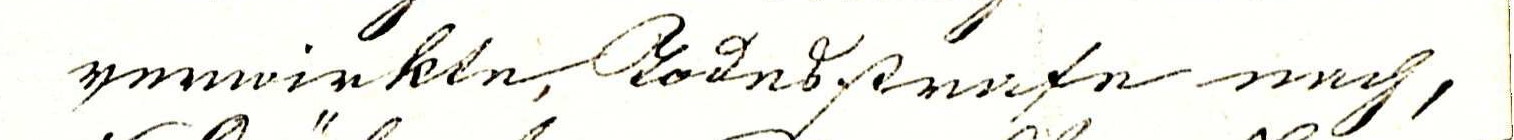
verwirkte, Todesstrafe nach,
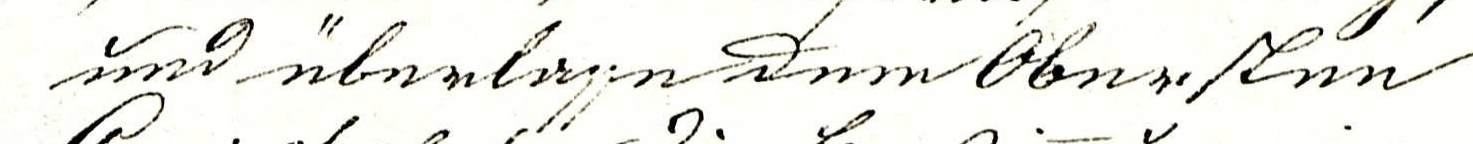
und überlasse dem Obersten
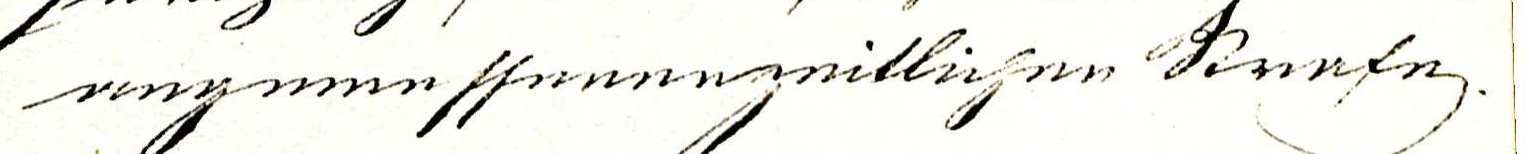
angemessenen zeitlichen Strafe.
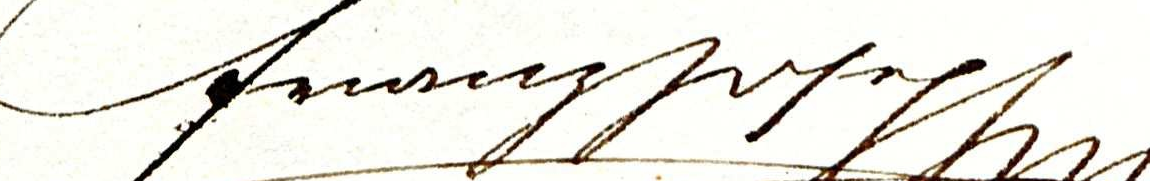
Franz Joseph
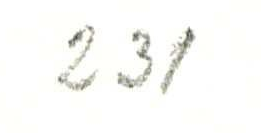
231
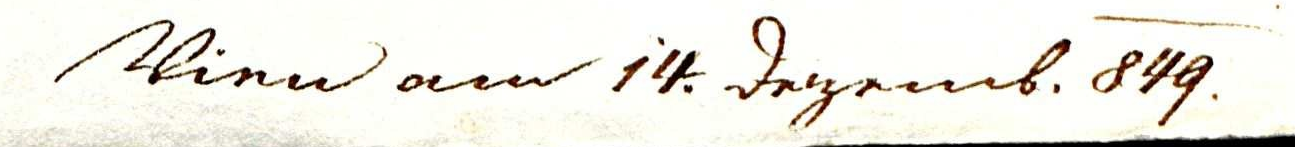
Wien am 14. Dezemb. 849.
